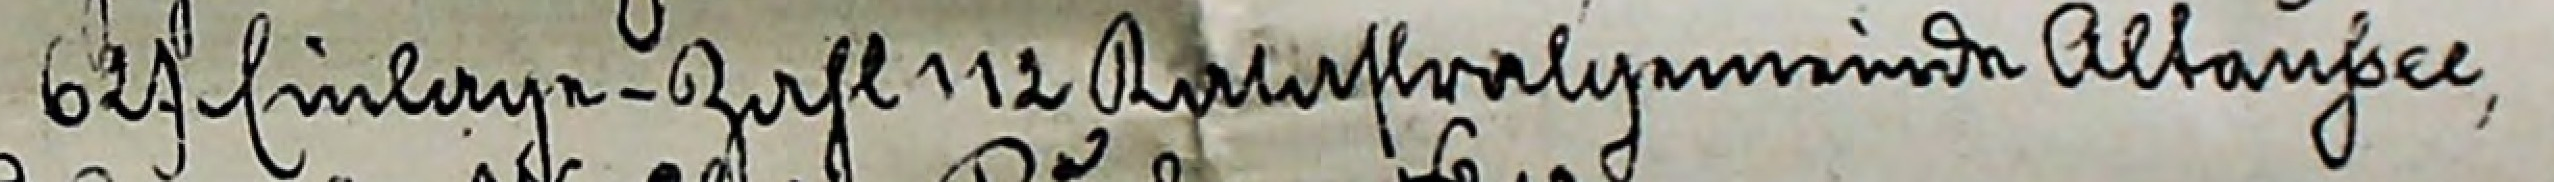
62.) Einlage - Zahl 112 Katastralgemeinde Altaussee,
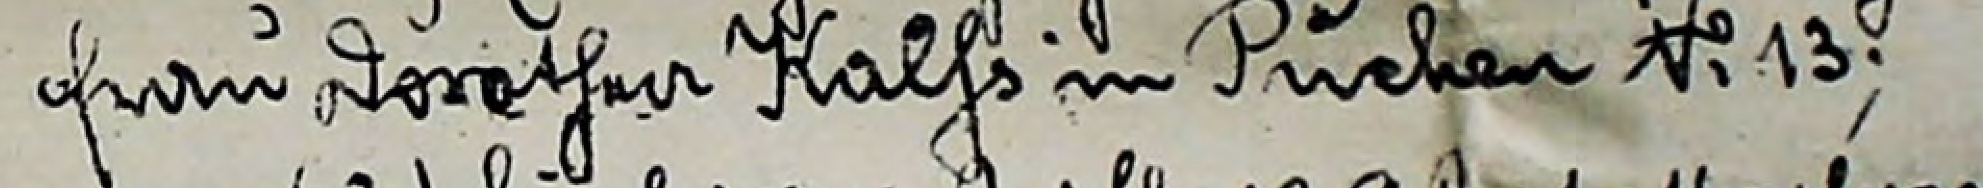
Frau Dorothea Kalhs in Puchen No 13;
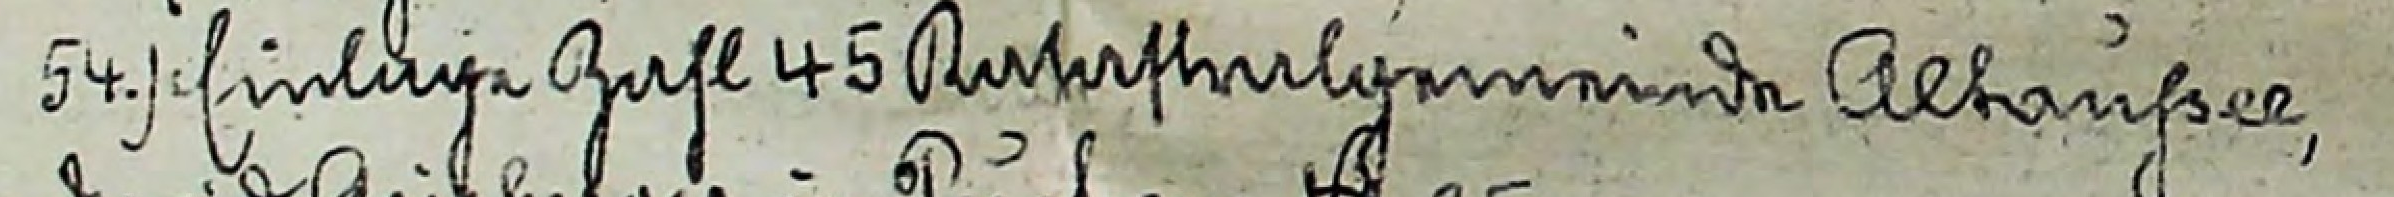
54.) Einlage - Zahl 45 Katastralgemeinde Altaussee,
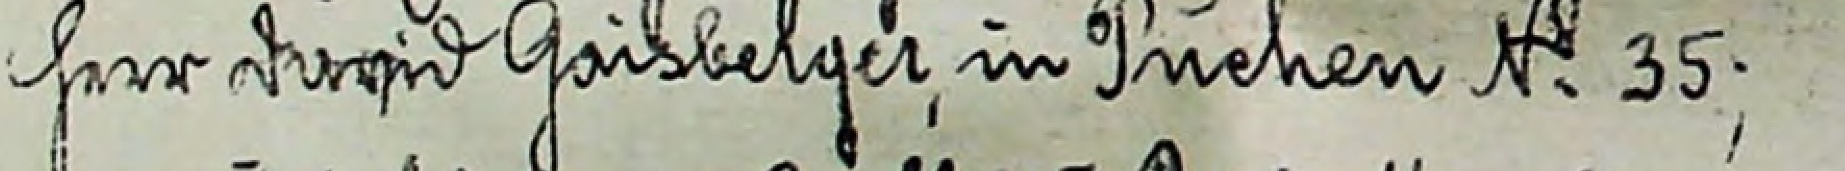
Herr David Gaisberger, in Puchen No 35;
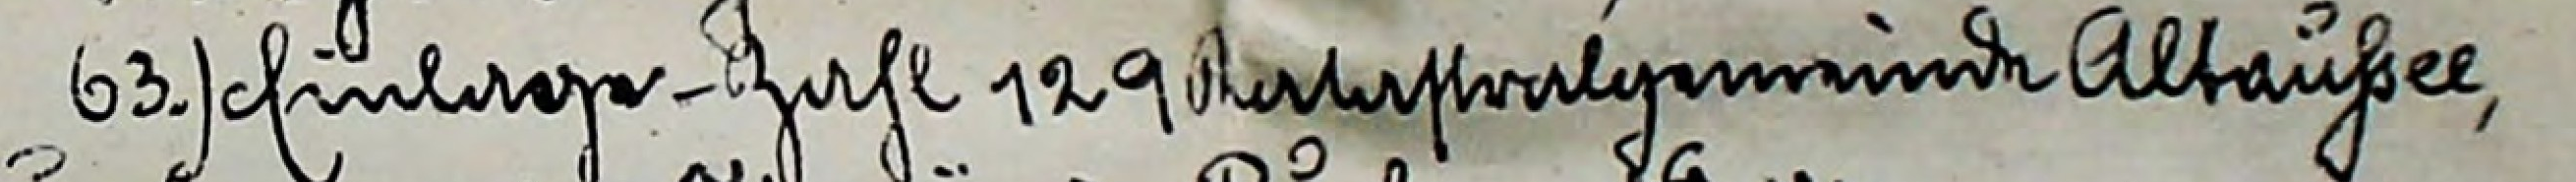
63.) Einlage - Zahl 129 Katastralgemeinde Altaussee,
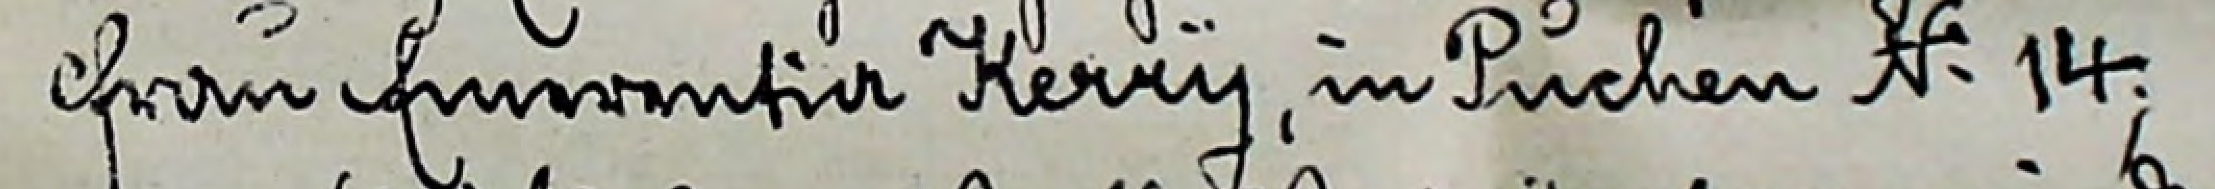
Frau Emerentia Kerrÿ, in Puchen No 14;
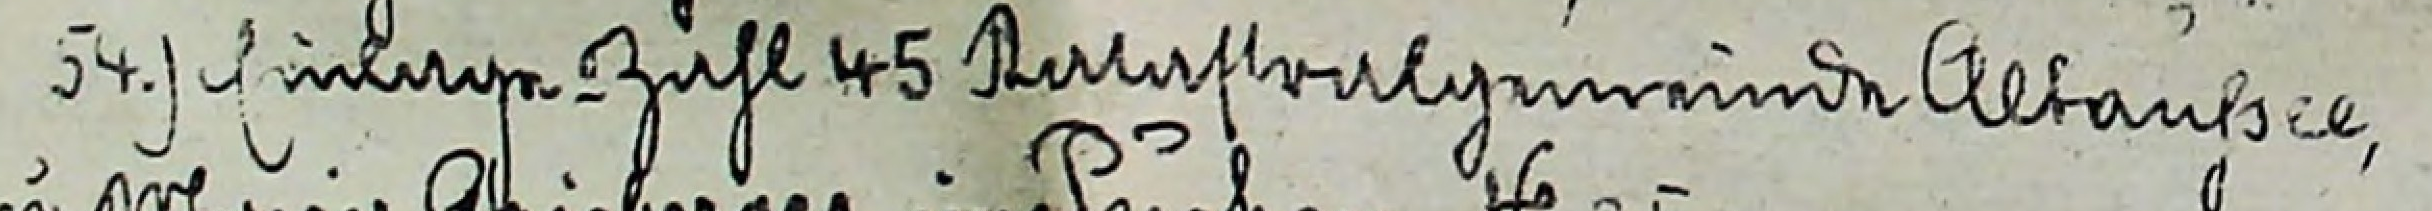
54.) Einlage - Zahl 45 Katastralgemeinde Altaussee,
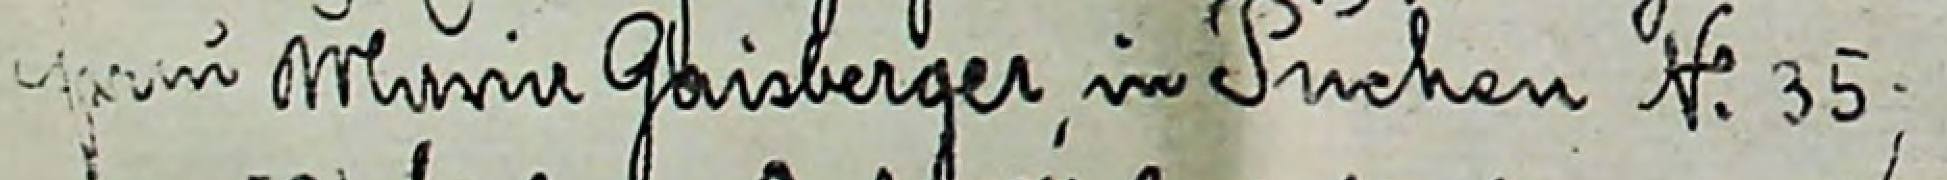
Frau Maria Gaisberger, in Puchen No 35;
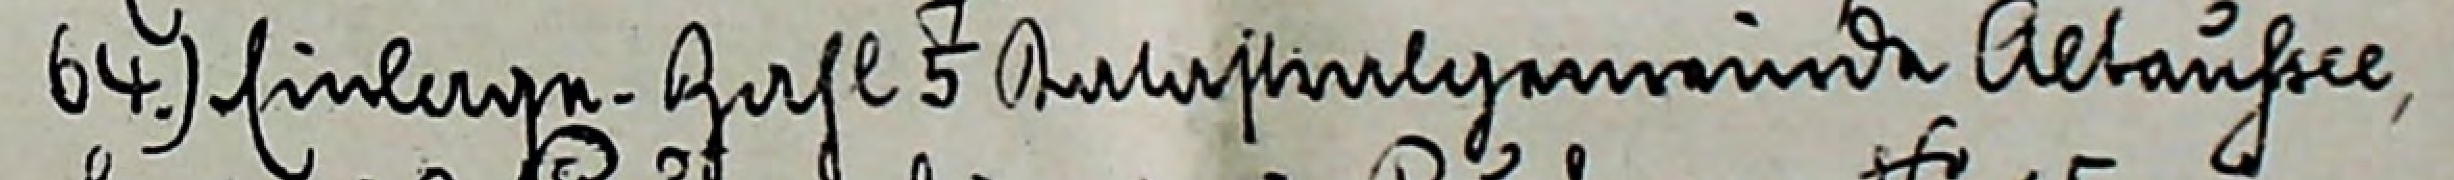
64.) Einlage - Zahl 5 Katastralgemeinde Altaussee,
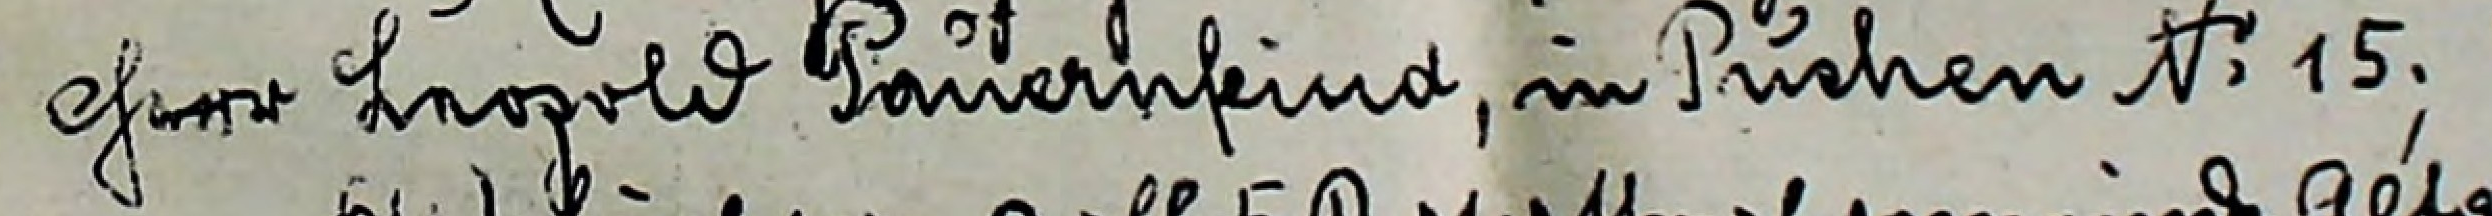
Herr Leopold Pauernfeind, in Puchen No 15;
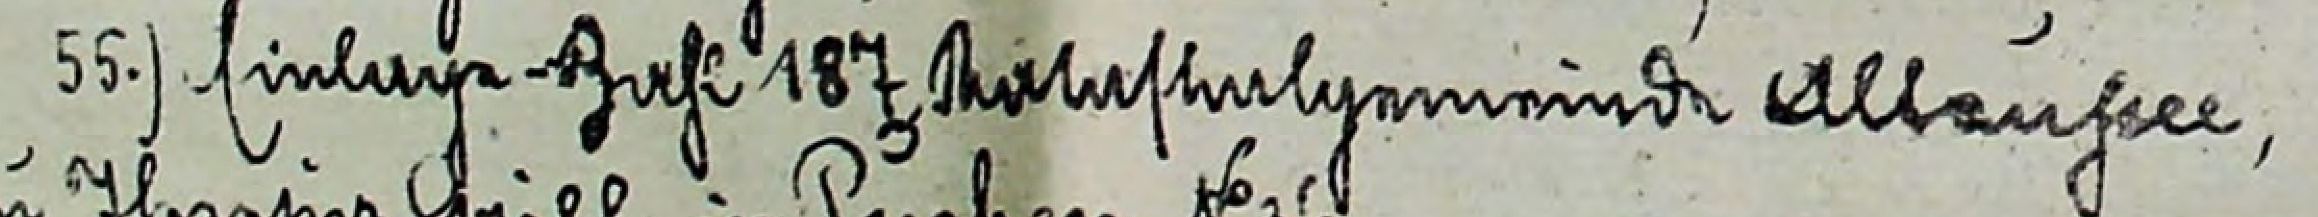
55.) Einlage - Zahl 187 Katastralgemeinde Altaussee,
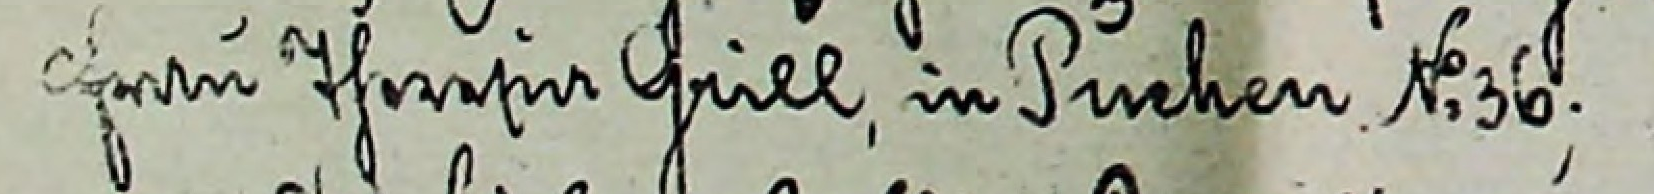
Frau Theresia Grill, in Puchen No 36;
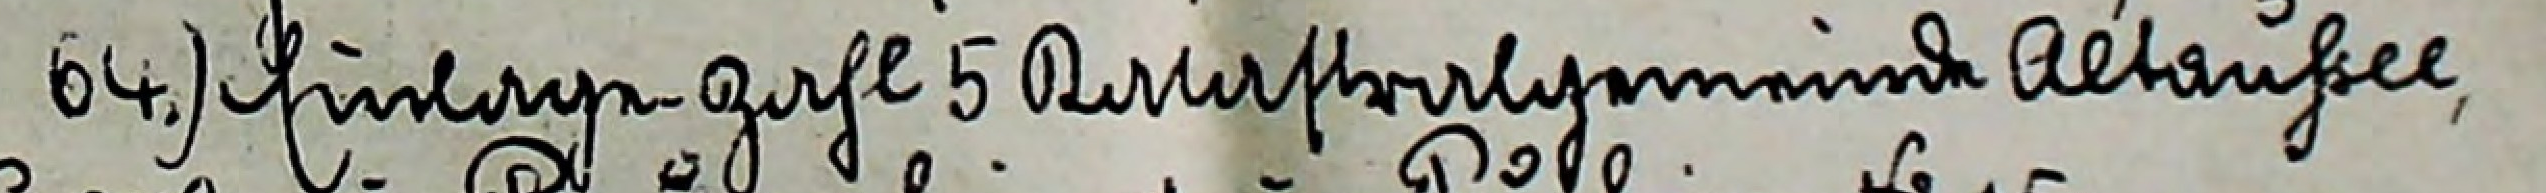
64.) Einlage - Zahl 5 Katastralgemeinde Altaussee,
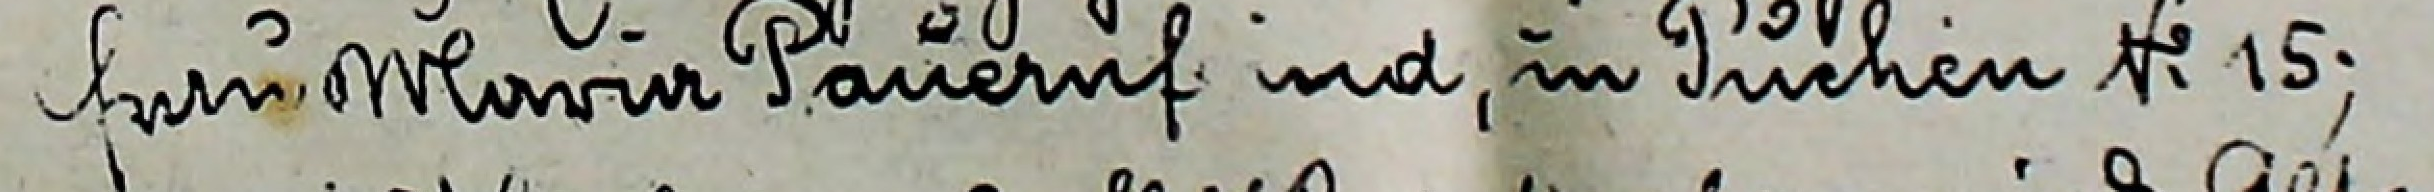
Frau Maria Pauernfeind, in Puchen No 15;
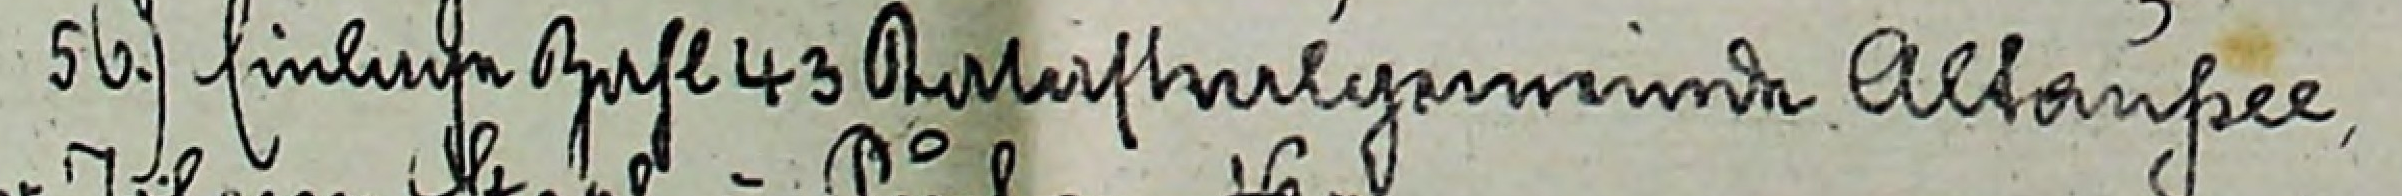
56.) Einlage Zahl 43 Katastralgemeinde Altaussee,
